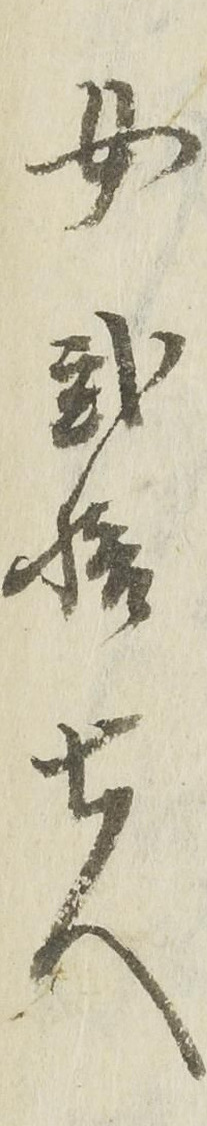女弐拾七人

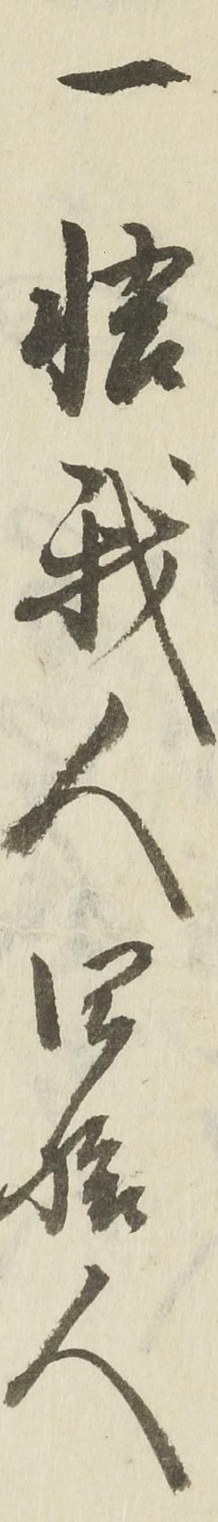一怪我人四拾人
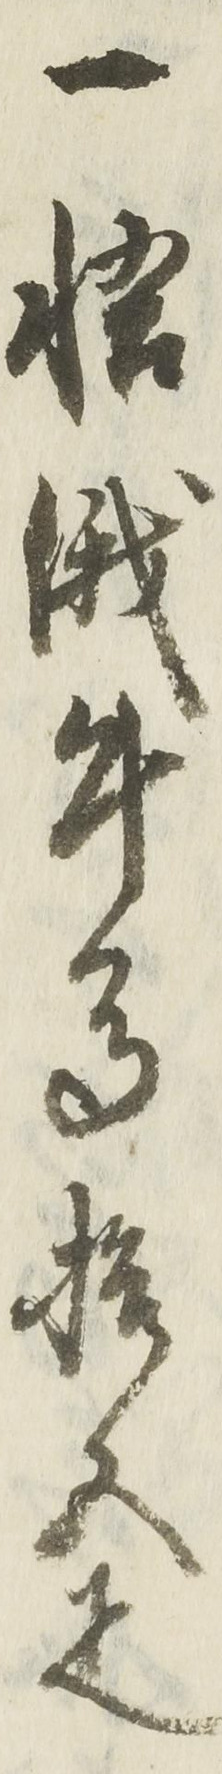一怪我牛馬拾五疋
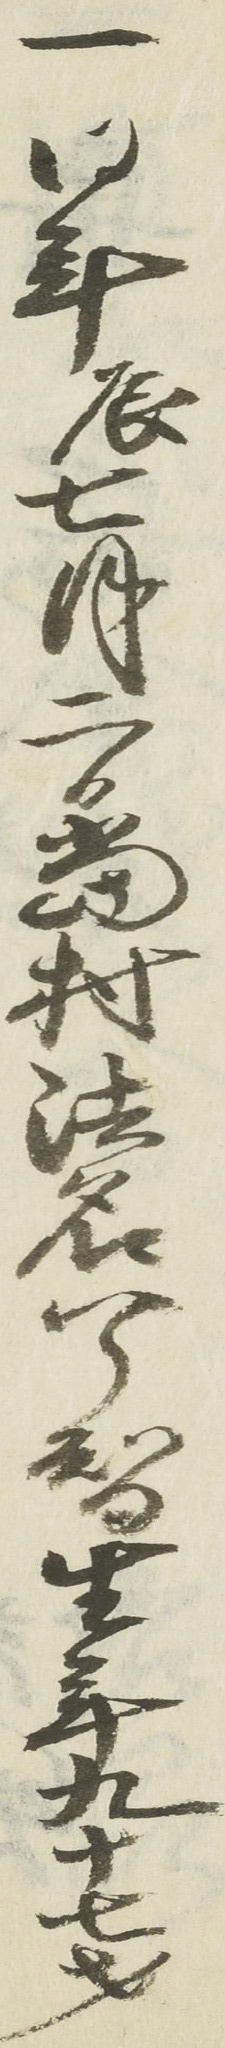一同年辰七月二日当村法名了智生年九十七才
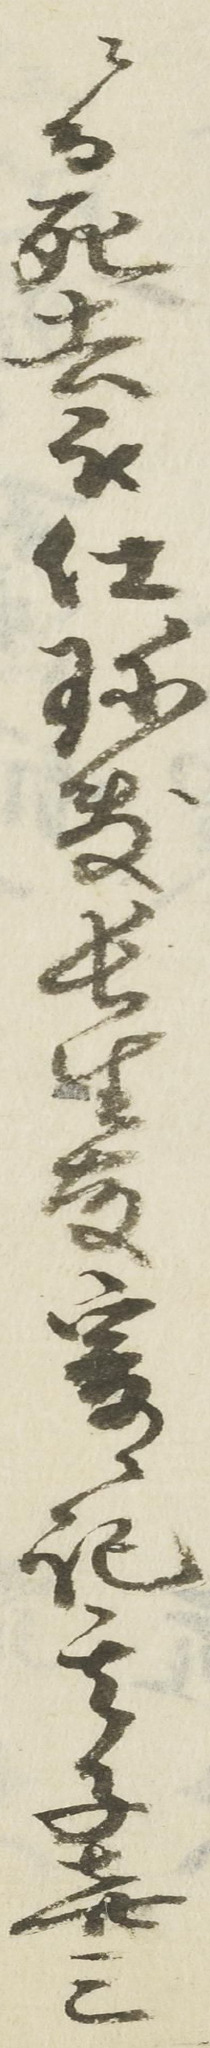ニ而死去被仕珍敷長生故爰ニ記其子喜三
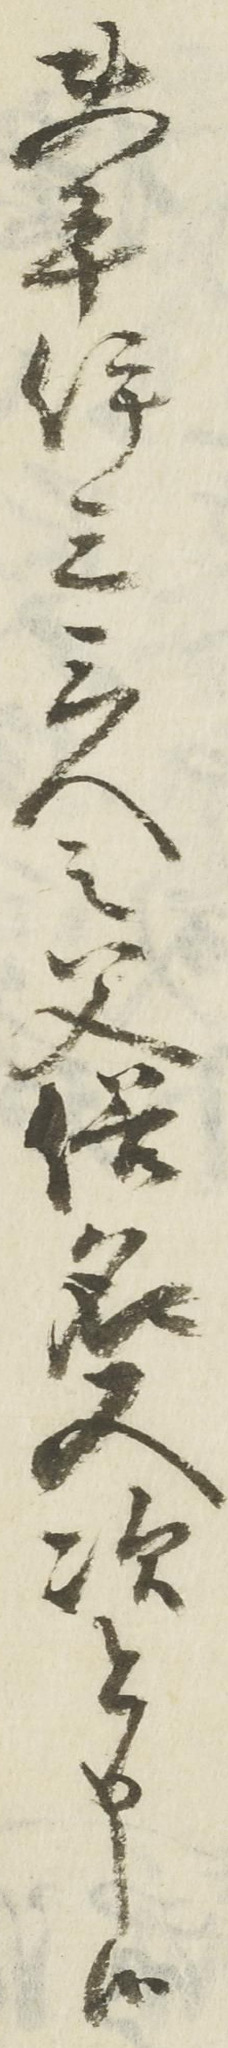夫平伊三三人之父俗名又次と申候
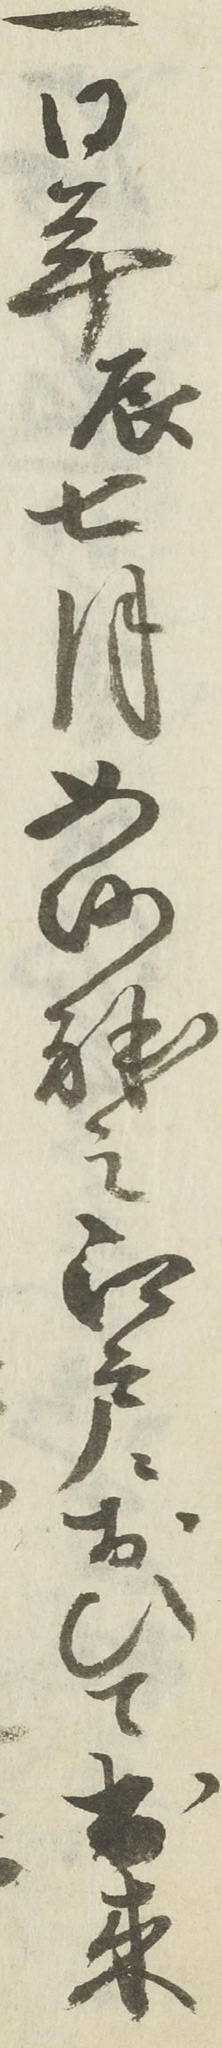一同年辰七月如何躰ニて江戸ニおひて出来
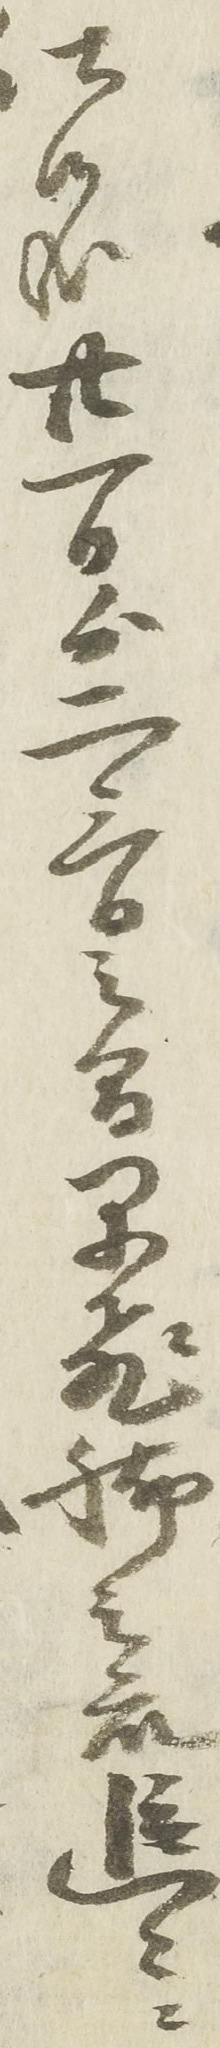仕候哉廿一日ゟ二三日之間早飛脚之衆追々ニ
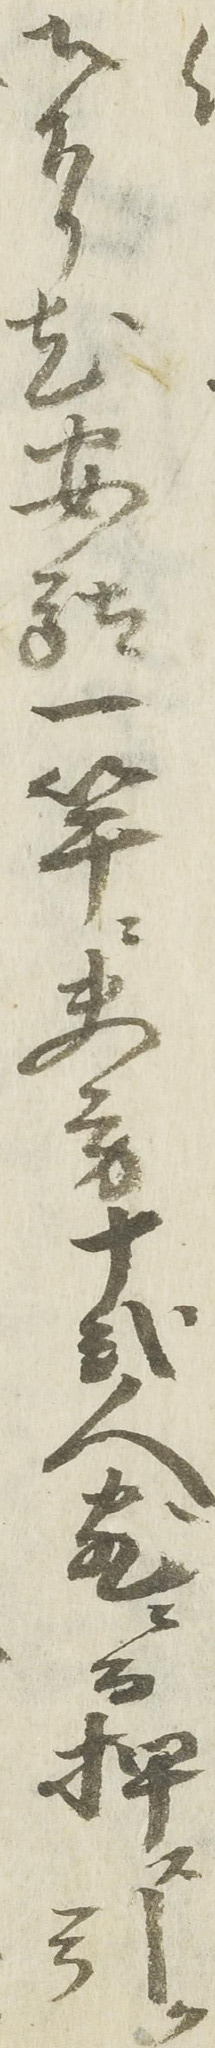御下り尤安駄一竿ニ夫方十弐人宛ニ而押ス引ク
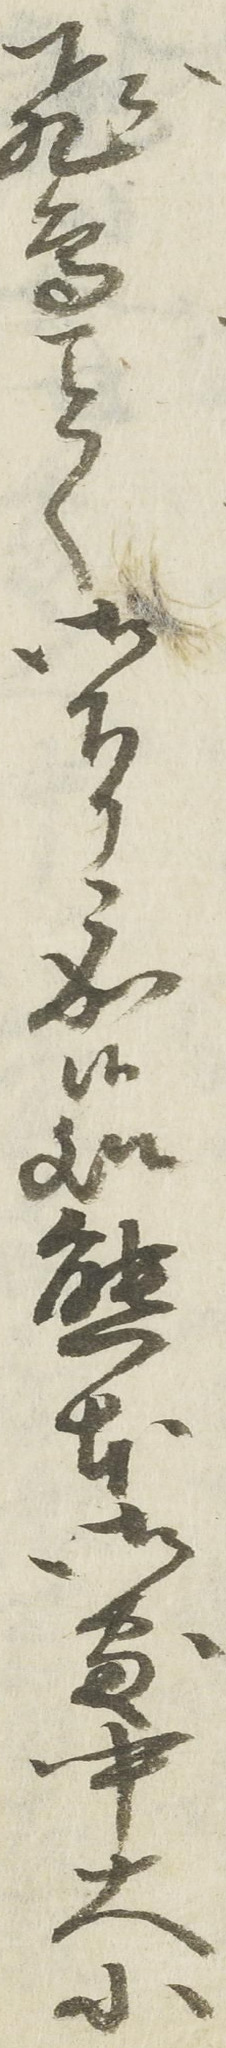飛鳥ことく御下り被成候処熊本御家中大小
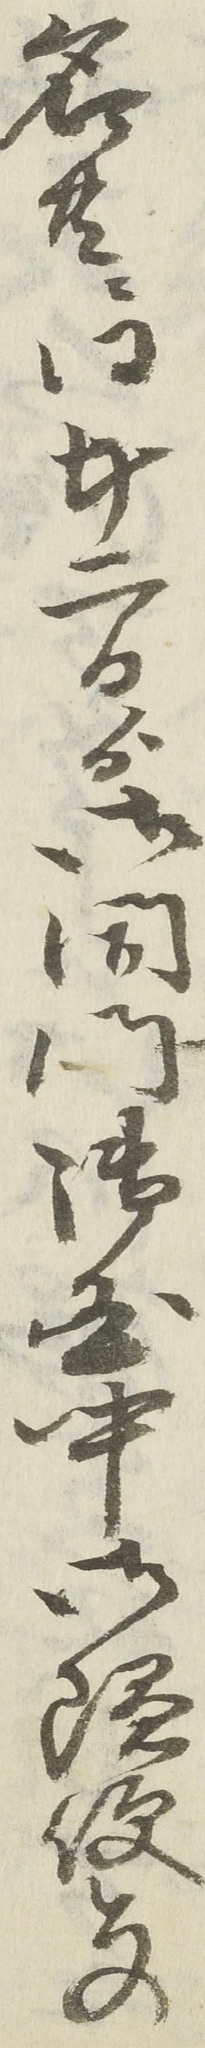名共ニ同廿二日ゟ御閉門御国中御穏便との
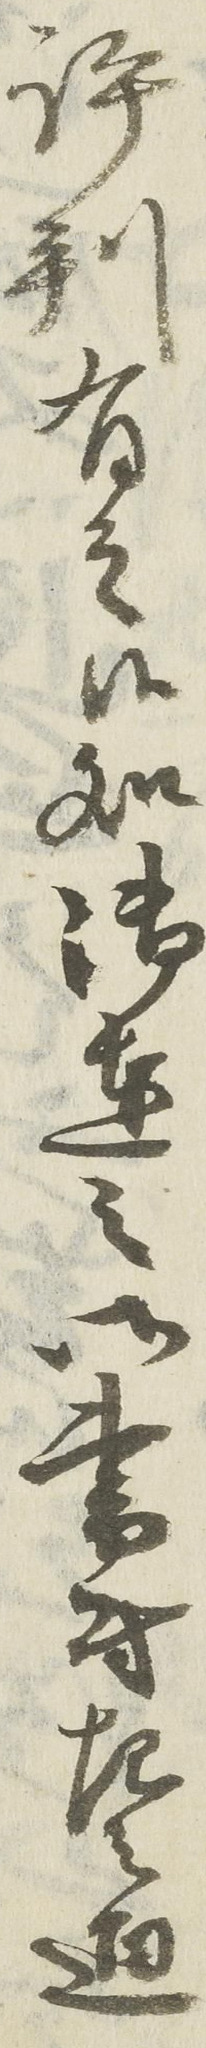評判有之候処御達之書付左之通
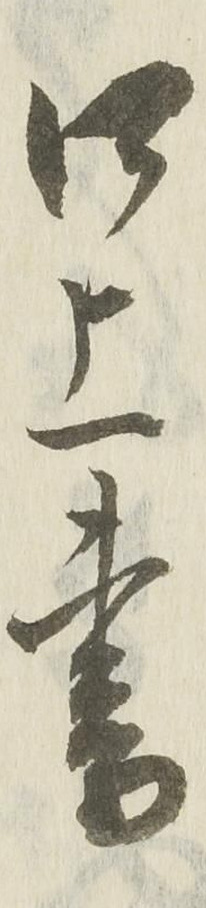口上書
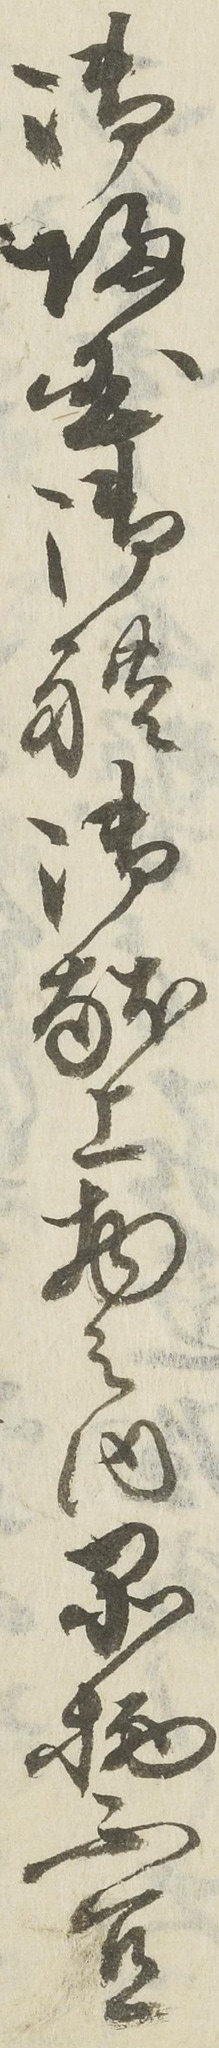御帰国御礼御献上物之内品物不宜
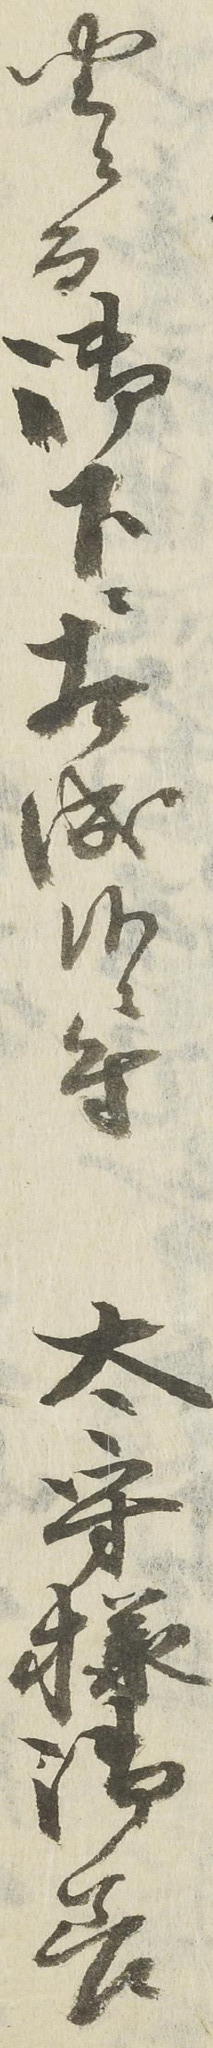由ニ而御下ニ相成候ニ付太守様御差
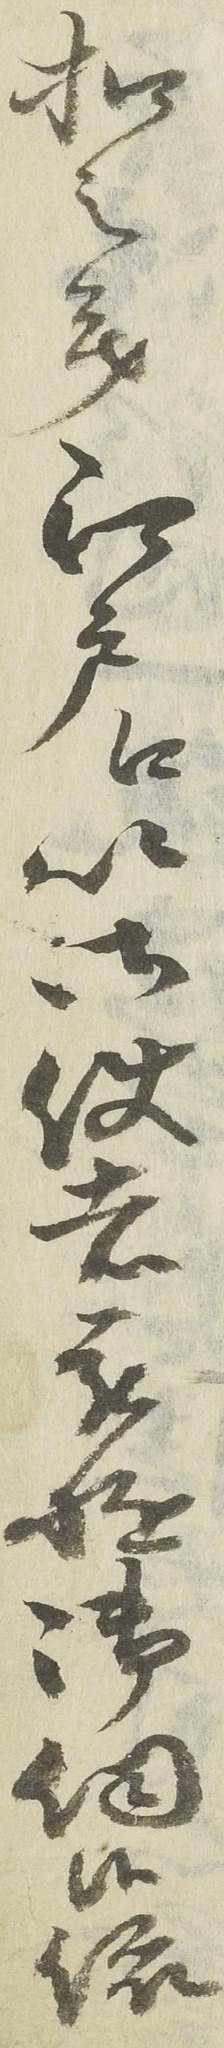扣之義江戸江以御使者被遊御伺候依
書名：後見笑
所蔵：東京大学地震研究所図書室 Earthquake Research Institute Library, The University of Tokyo, JAPAN
